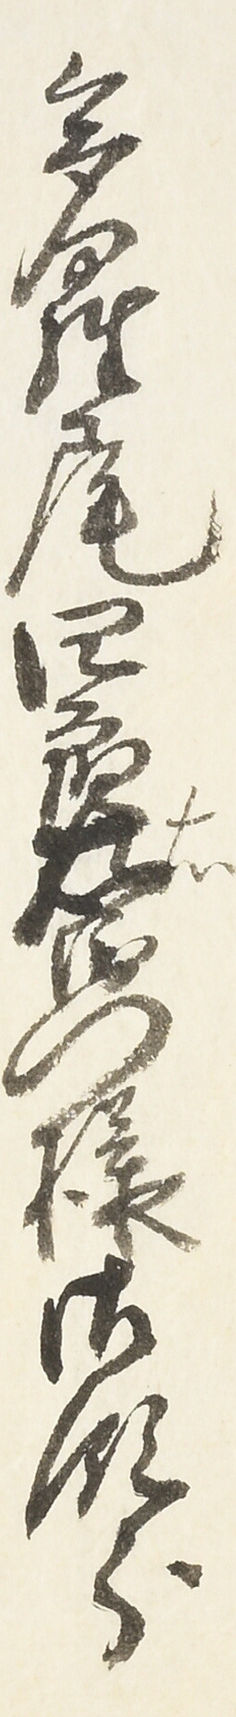多羅尾四郎右衛門様御領分
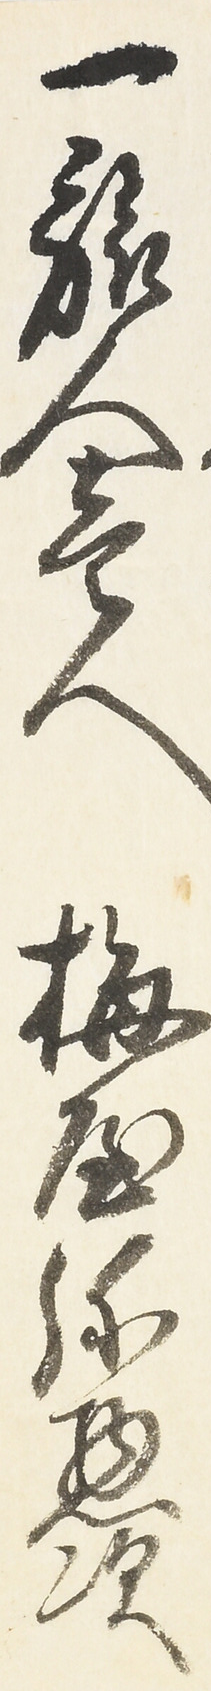一旅人壱人梅屋弥惣次
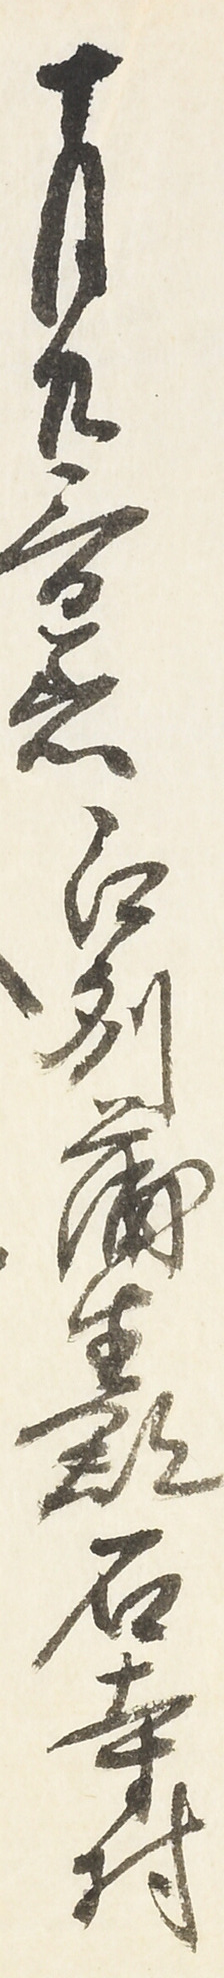十月廿三日着江州蒲生郡石寺村
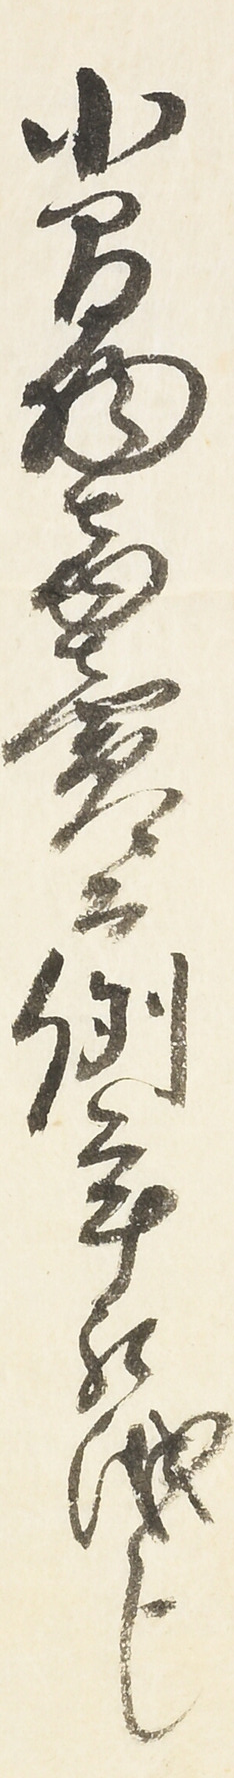小間物商売ニ而例年罷越申候
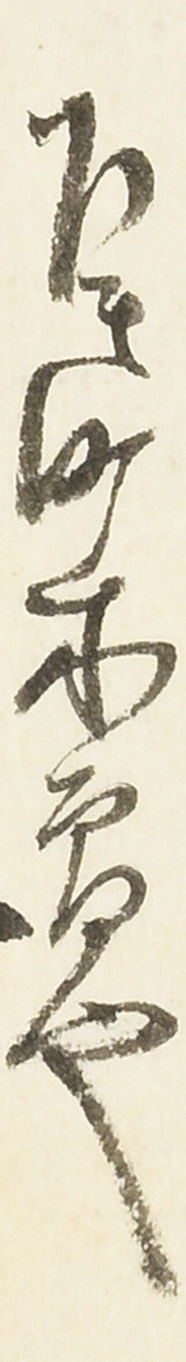下モ町木曽や
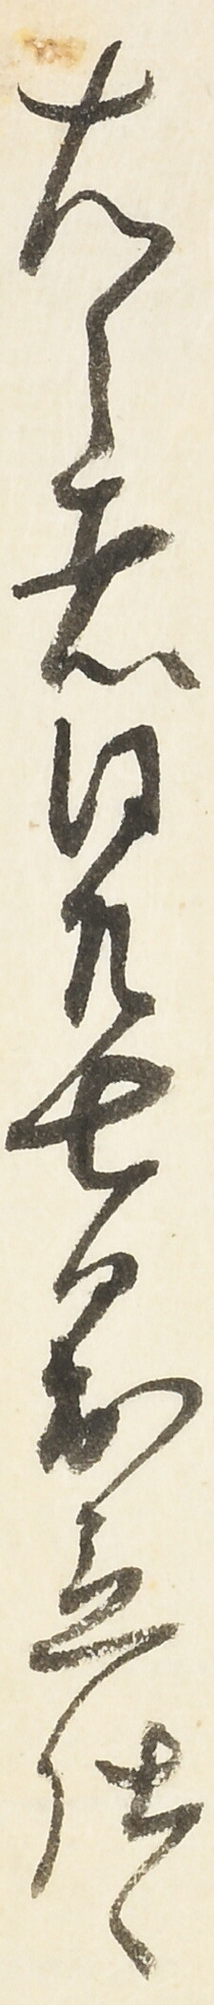右之者同廿七日出立仕候
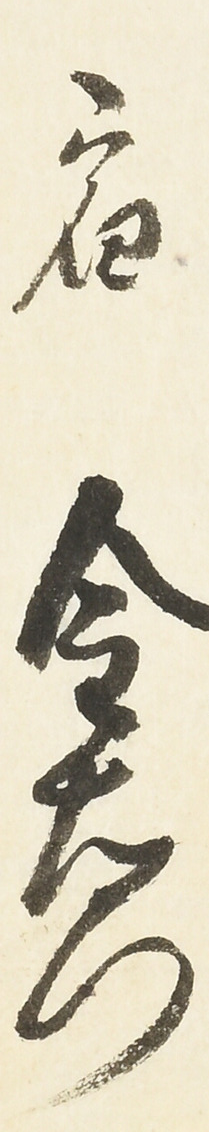宿金右衛門
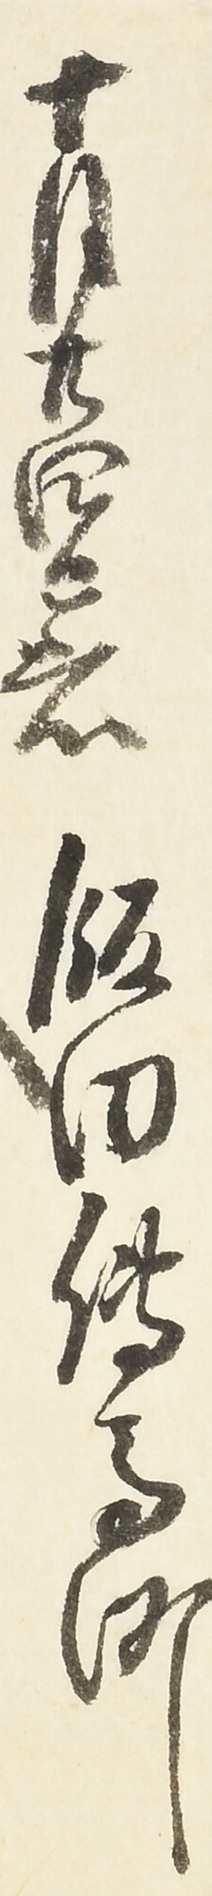十月廿四日着飯田伝馬町
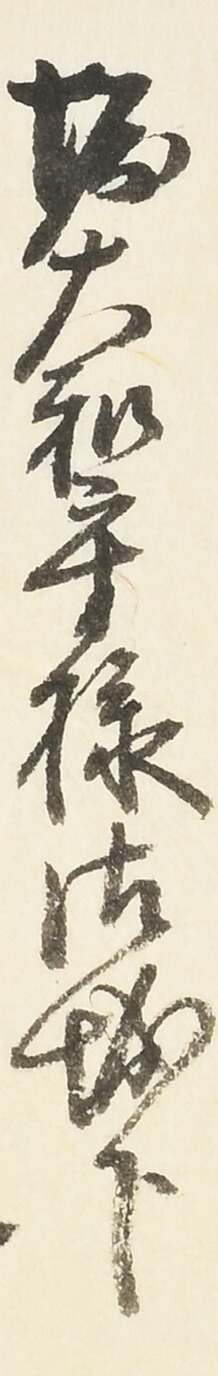堀大和守様御城下
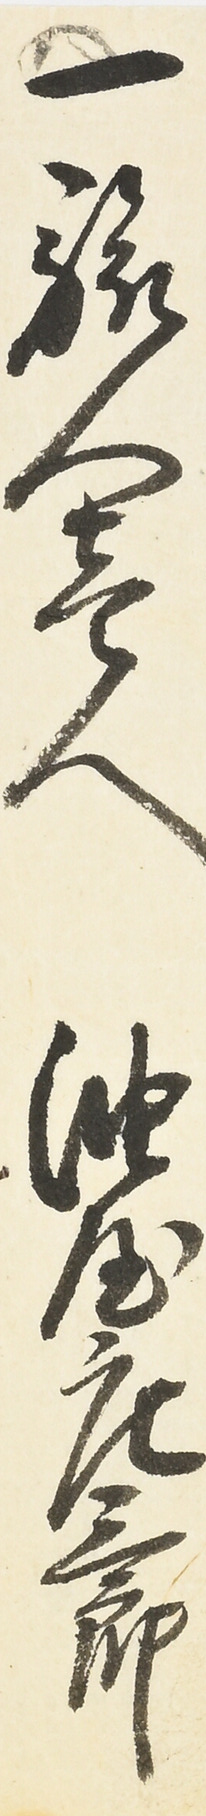一旅人壱人油屋庄三郎
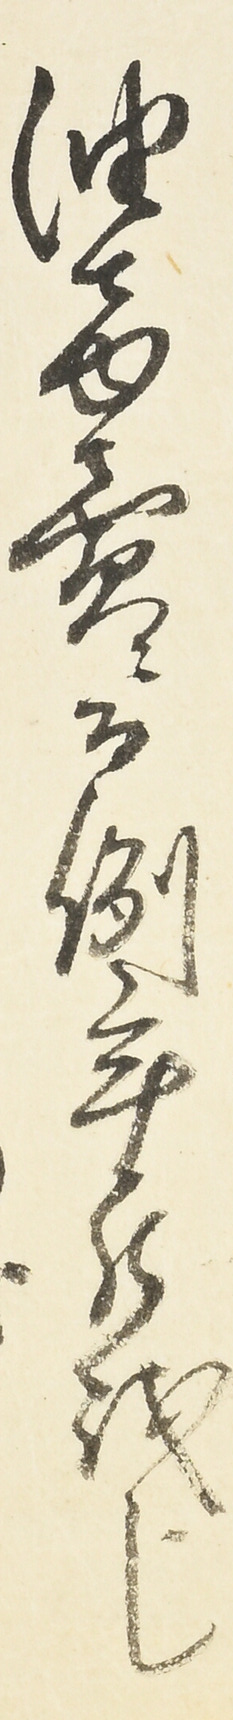油商売ニ而例年罷越申候
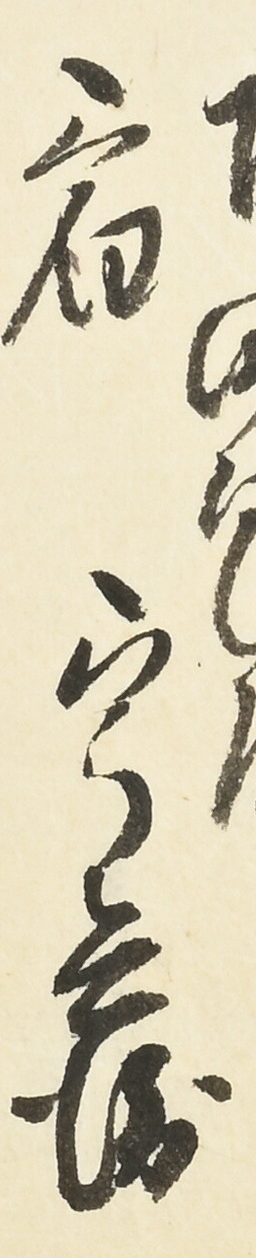宿宇兵衛
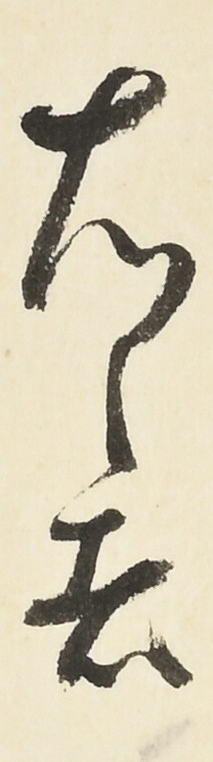右之者
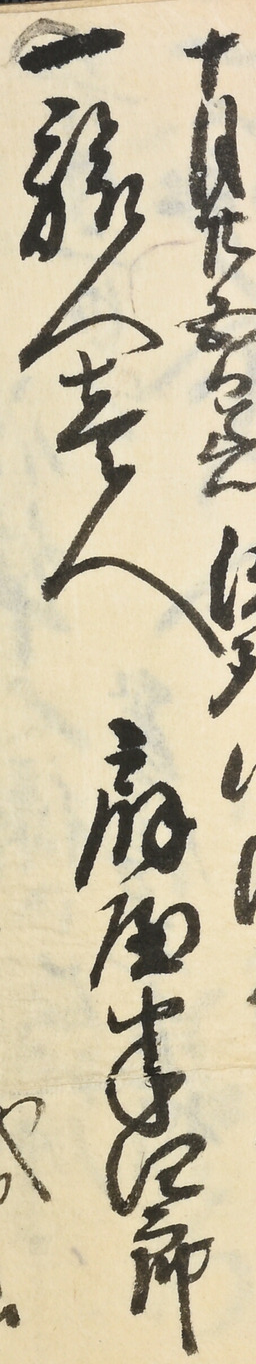一旅人壱人油屋庄三郎

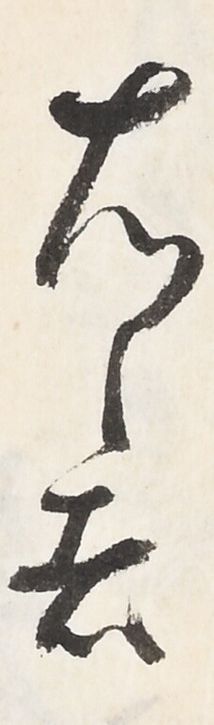右之者
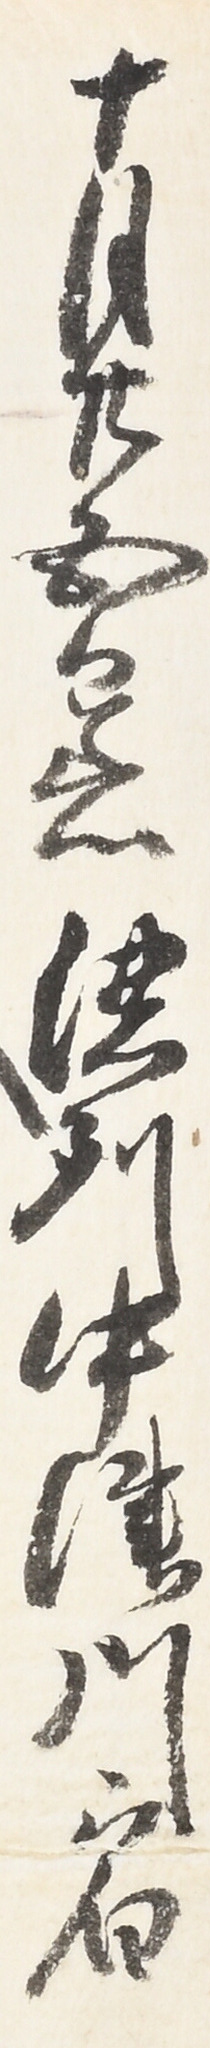十月廿五日着濃州中津川宿
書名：町中旅人泊控帳
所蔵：伊那市立高遠町図書館・合同会社AMANE
